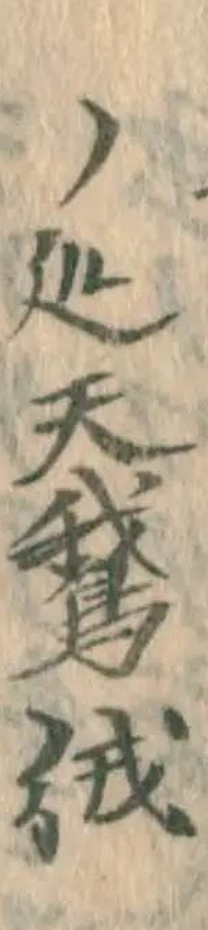ノ処天鵞絨
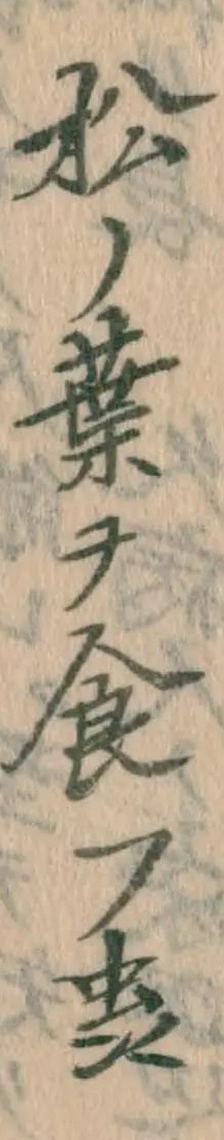松ノ葉ヲ食フ蟲
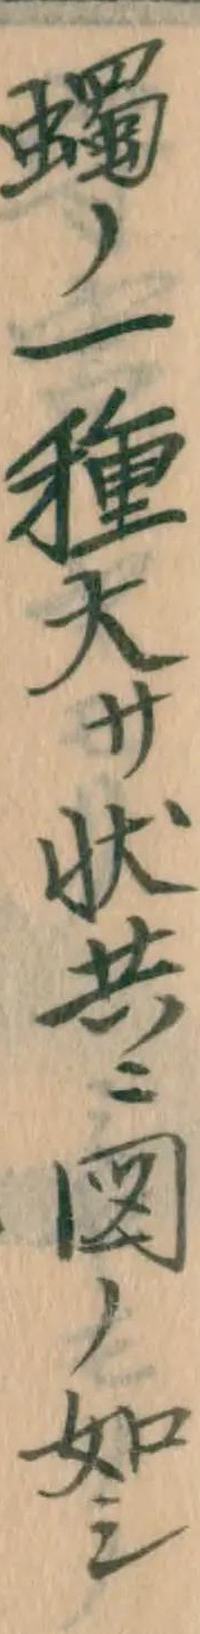蠋ノ一種大サ状共ニ図ノ如シ
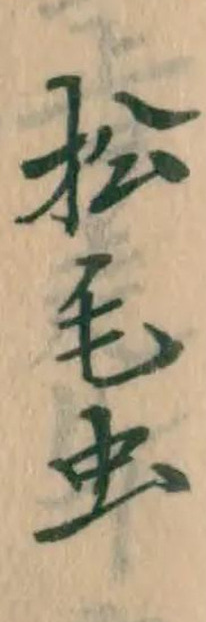松毛虫
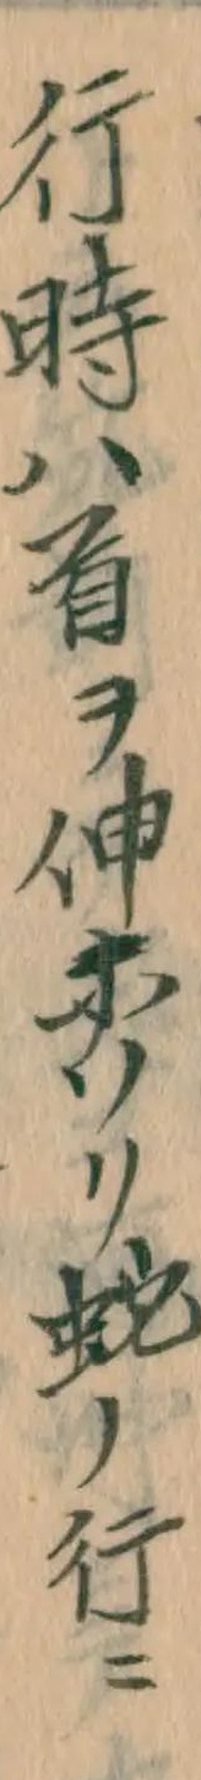行時ハ首ヲ伸ホソリ蛇ノ行ニ
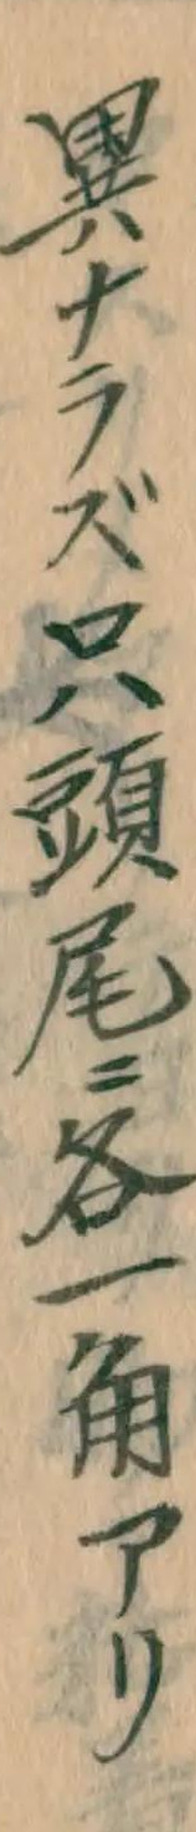異ナラズ只頭尾ニ各一角アリ

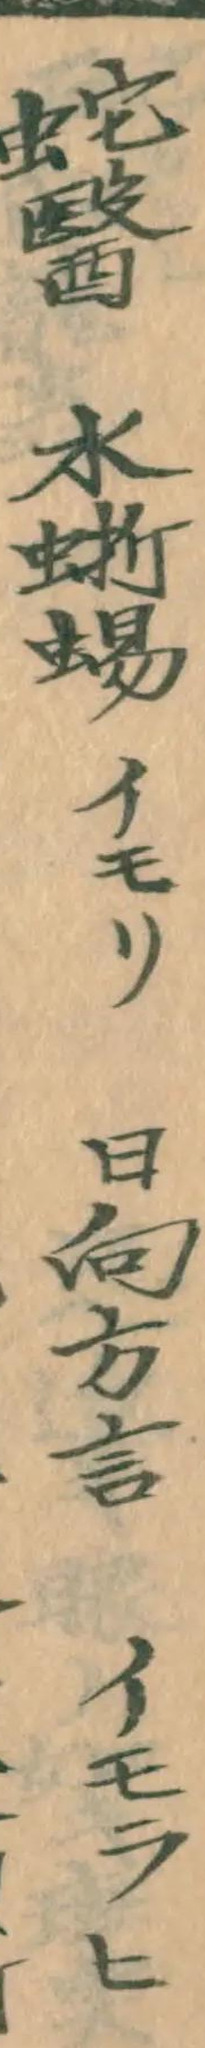蛇醫水蜥蜴イモリ日向方言イモラヒ
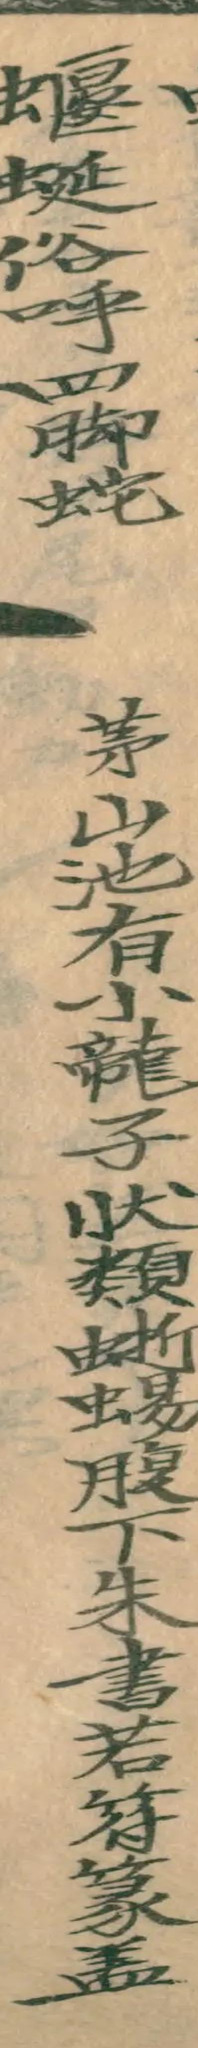蝘蜒俗呼四脚蛇茅山池有小㡣子状類蜥蜴腹下朱書若符篆盖
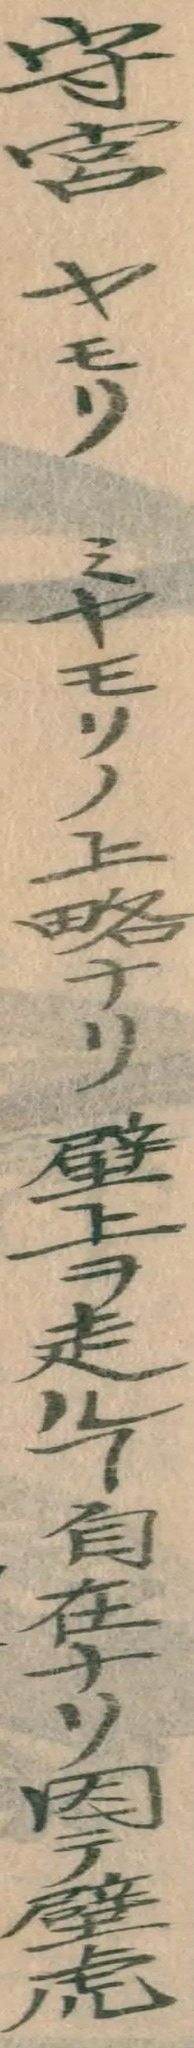守宮ヤモリミヤモリノ上略ナリ壁上ヲ走ルコト自在ナリ因テ壁虎
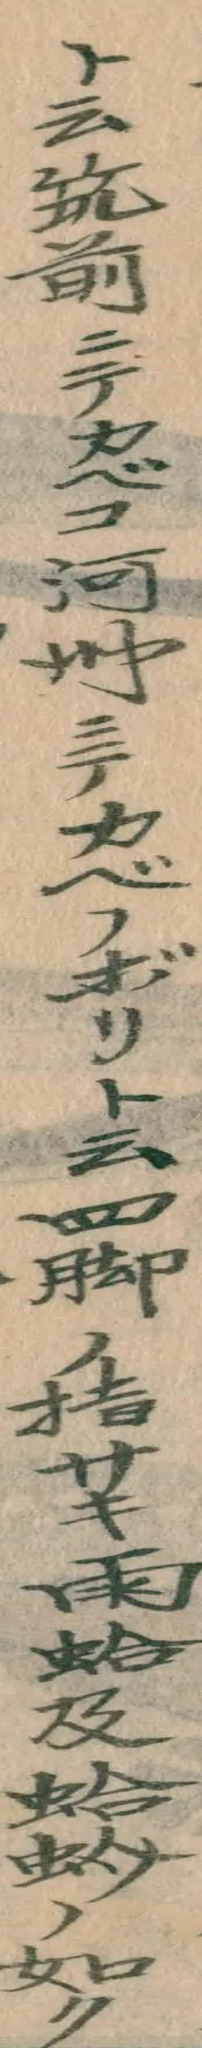ト云筑前ニテカベコ河州ニテカベノボリト云四脚ノ指サキ雨蛤及蛤蚧ノ如ク
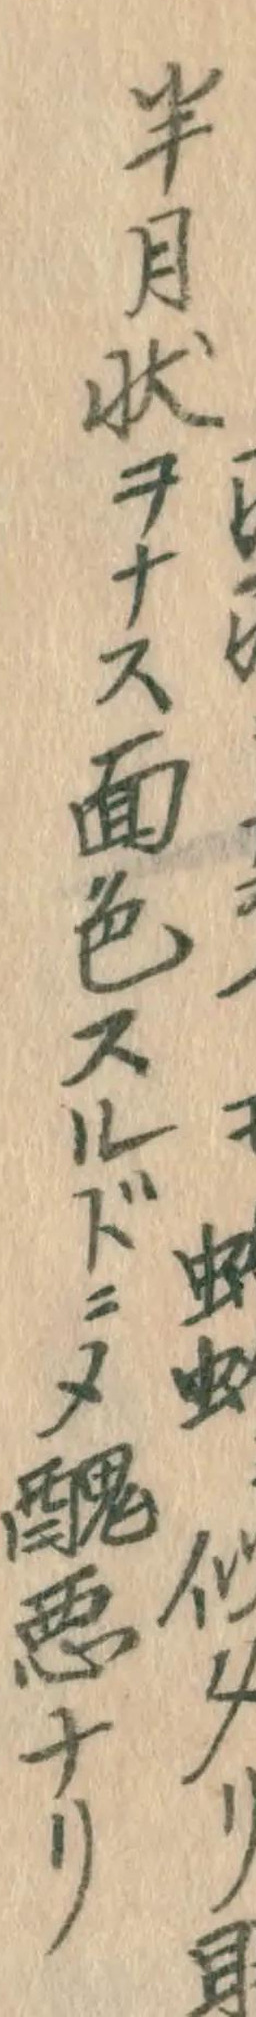半月状ヲナス面色スルドニシテ醜悪ナリ

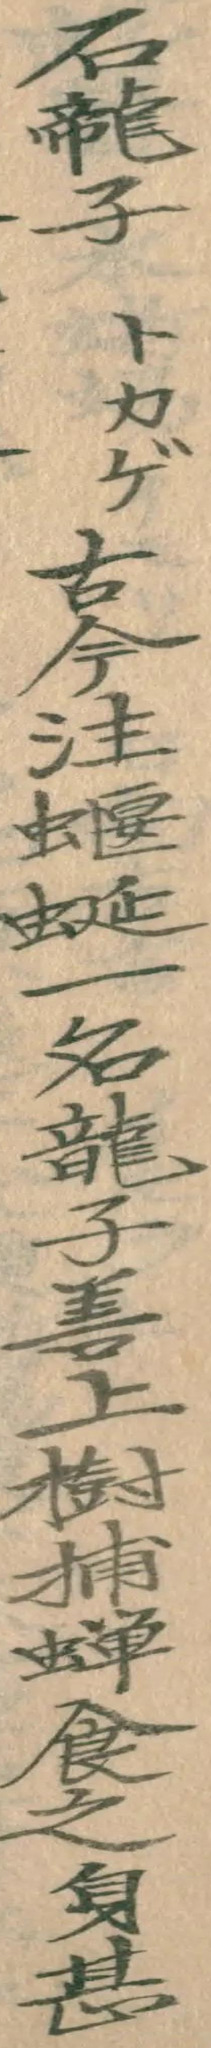石㡣子トカゲ古今注蝘蜒一名龍子善上樹捕蝉食之身甚
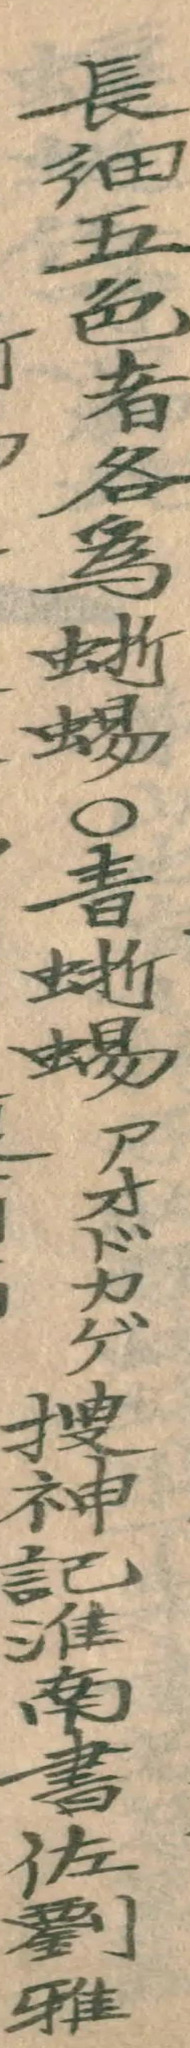長細五色者各爲蜥蜴○青蜥蜴アオドカゲ捜神記淮南書佐雅
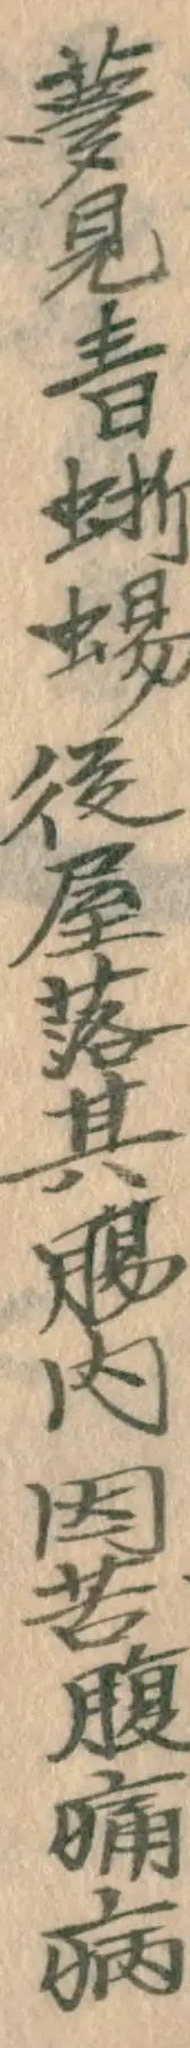夢見青蜥蜴従屋落其膓内因苦腹痛病
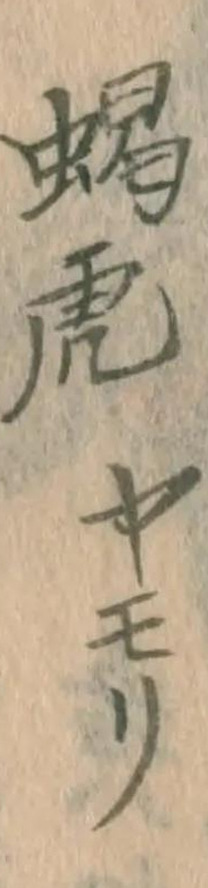蝎虎ヤモリ

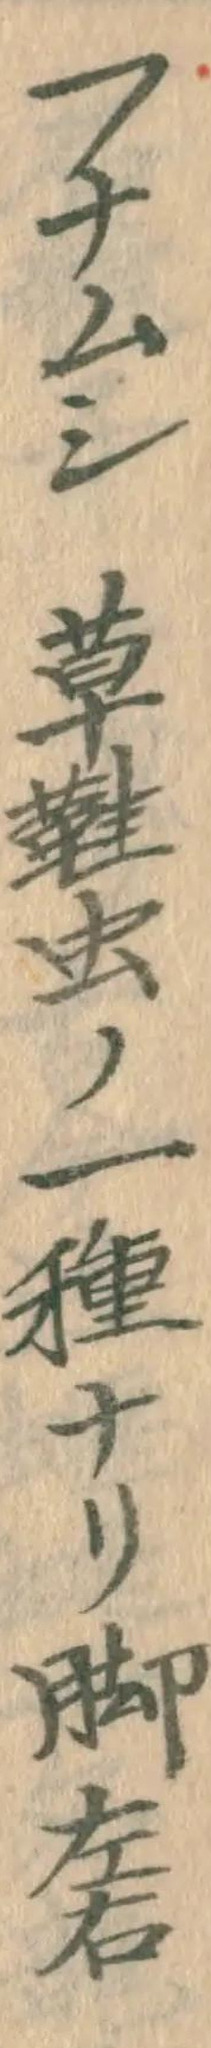フナムシ草鞋虫ノ一種ナリ脚左右
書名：千蟲譜 3巻. [2]
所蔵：国立国会図書館 National Diet Library, JAPAN
